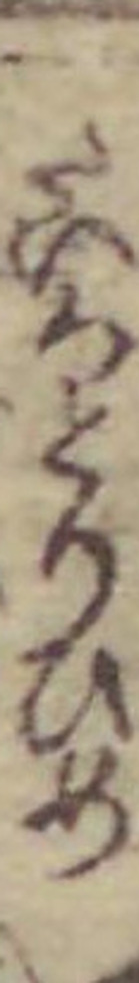さいかとりひめ
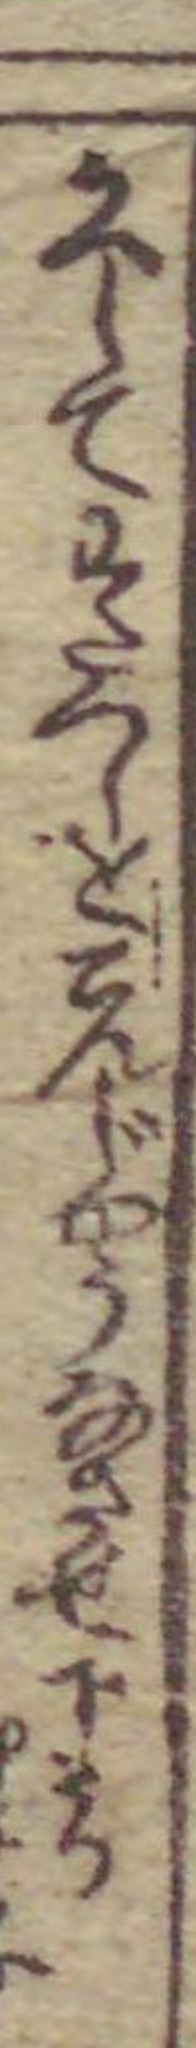かへしてわたくしをてんじやうなさせ下さり
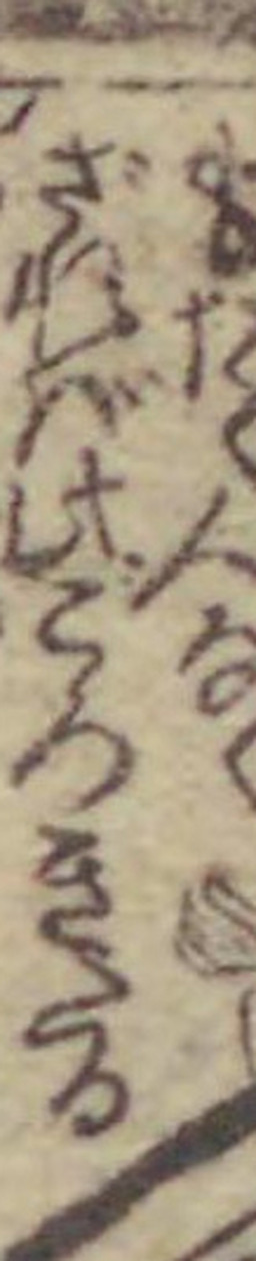ざれば此ごろきたる
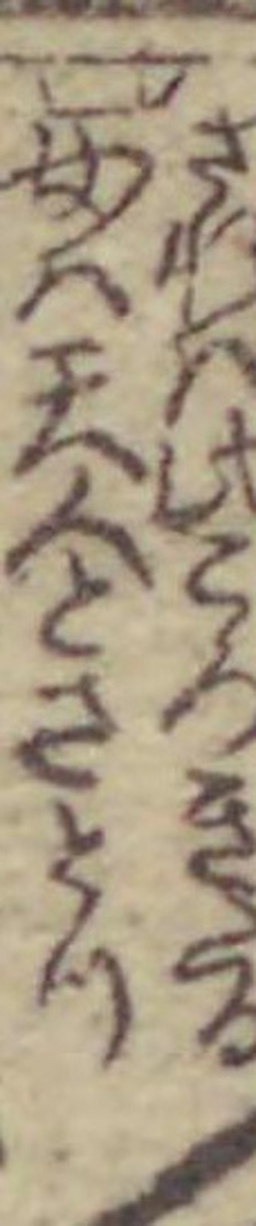女は天人とさとり
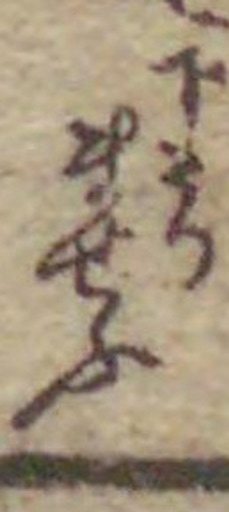ませふ
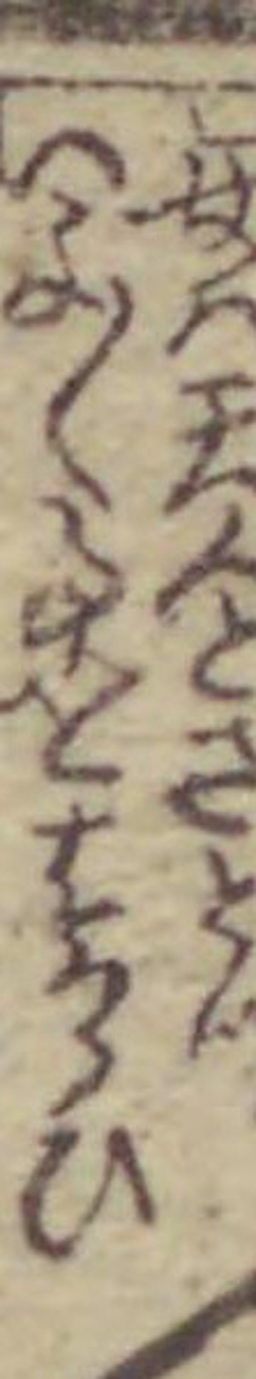いよ〳〵事をはからひ
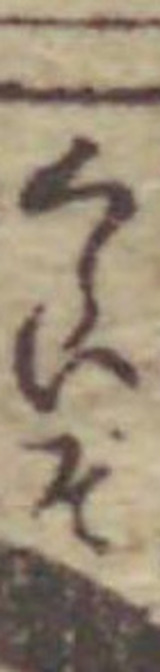くしいそ
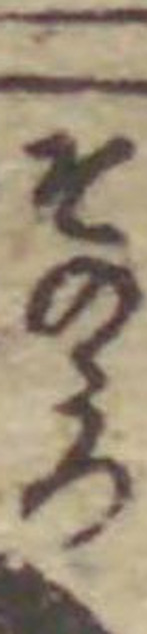そのうつ
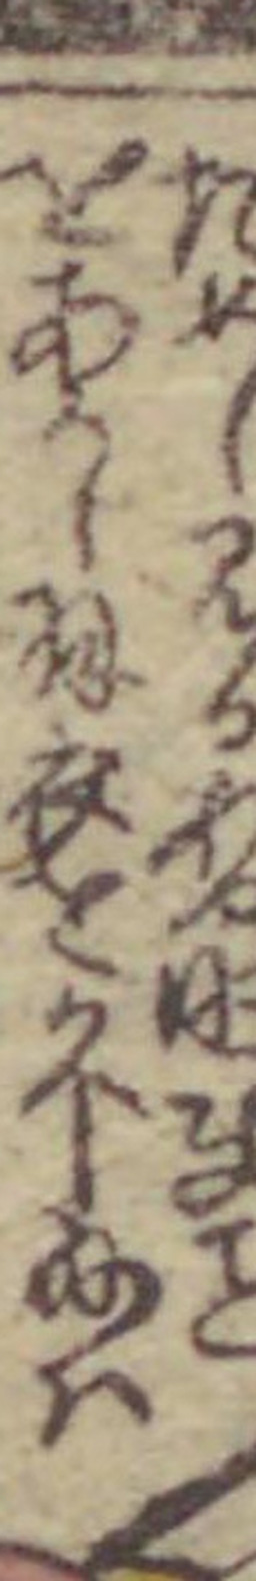をあかし羽衣をかへし給は
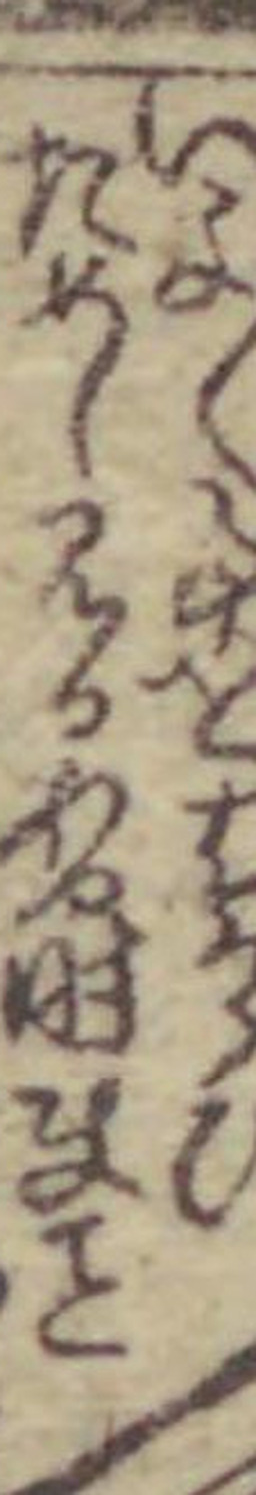ためし見るある時まこと
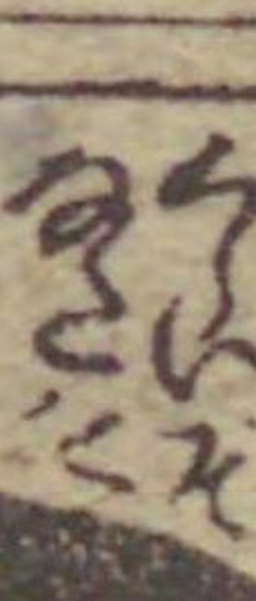なたを
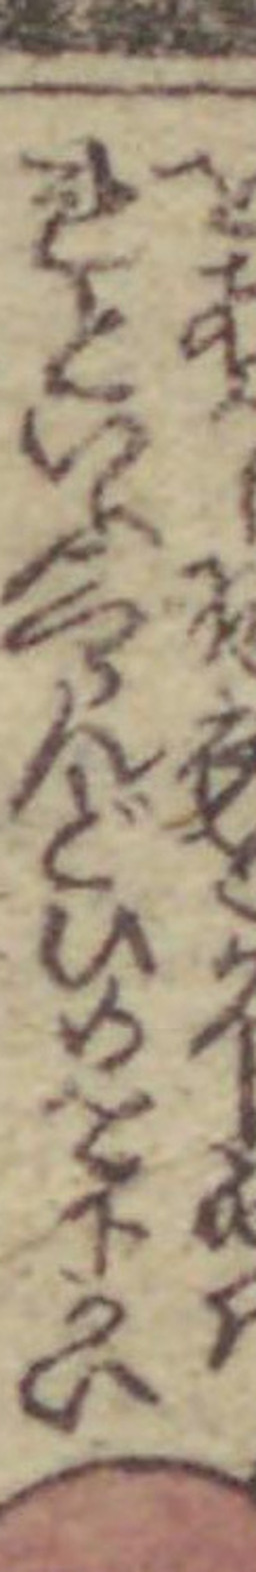れといふくらんどひめを下かい
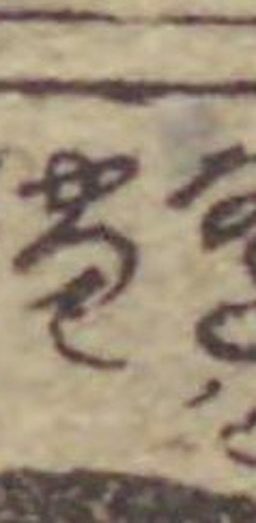やつて
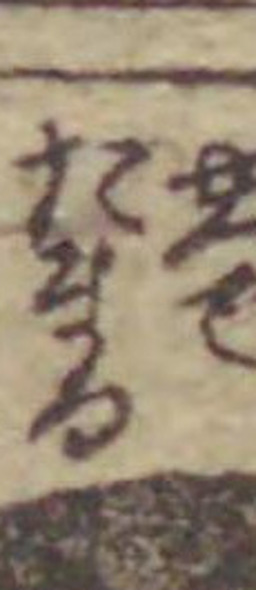たまる
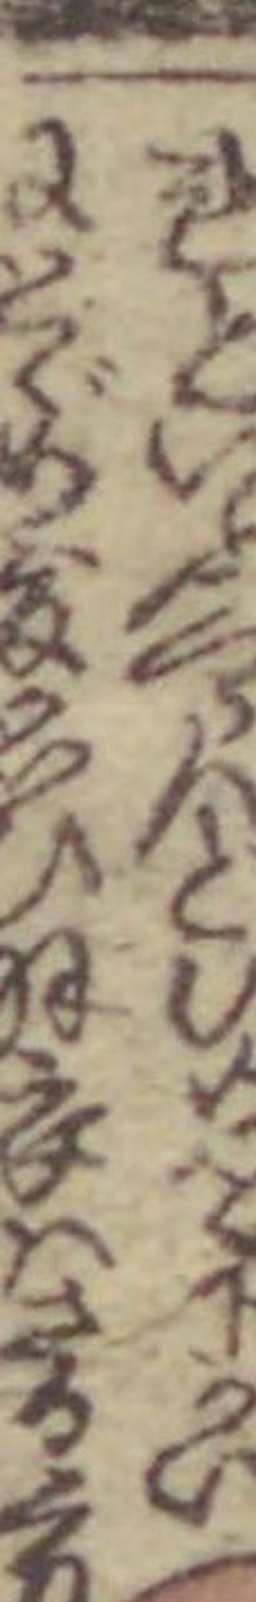にとゞめ度思ひ羽衣はさる方
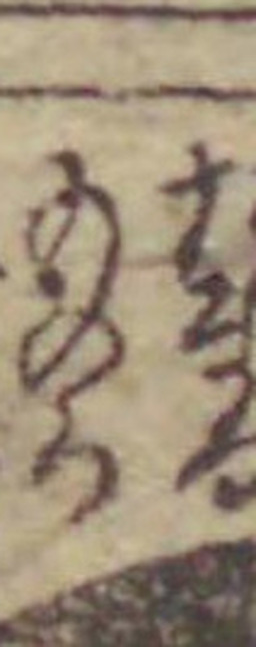ものか
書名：娜二代鉢木 5巻
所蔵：国立国会図書館 National Diet Library, JAPAN
